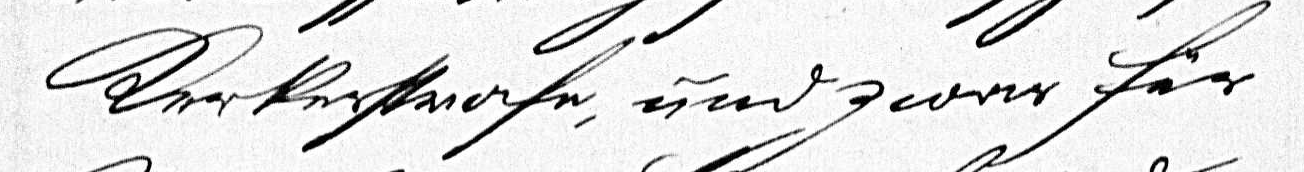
kerkerstrafe, und zwar für
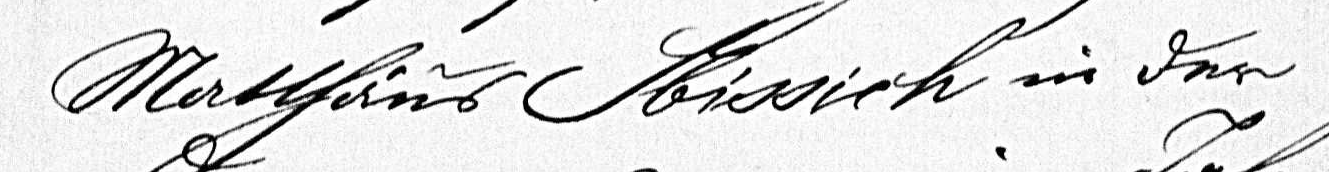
Matthäus Sbissich in der
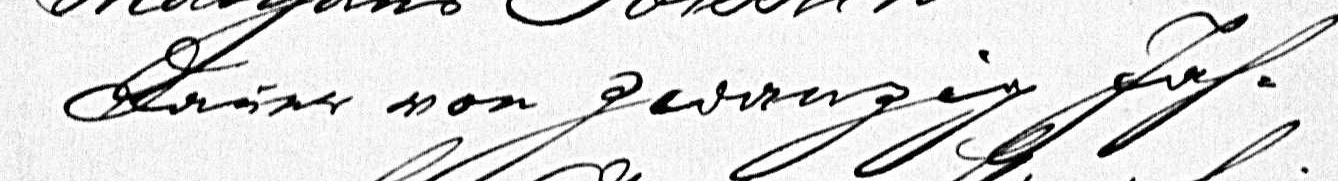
Dauer von zwanzig Jah¬
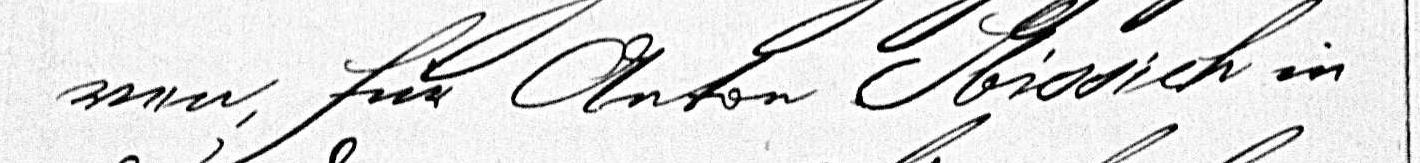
ren, für Anton Sbissich in
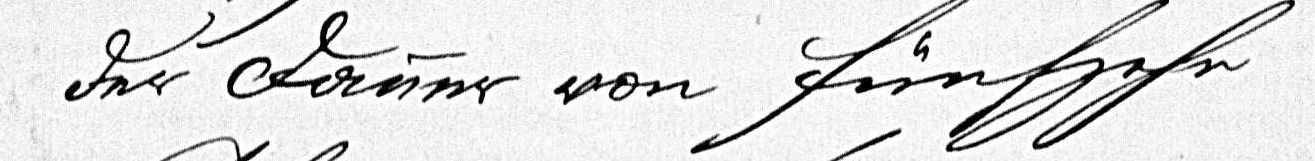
der Dauer von fünfzehn
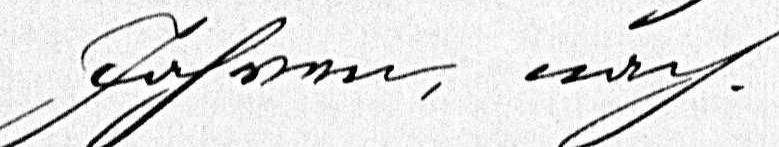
Jahren, nach.
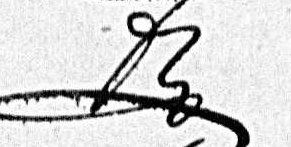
FJ
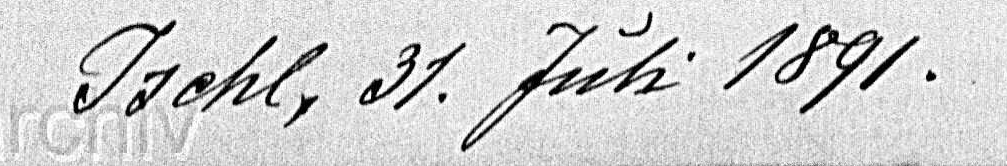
Ischl 31. Juli 1891
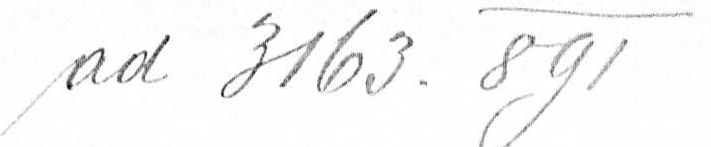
ad 3163. 891
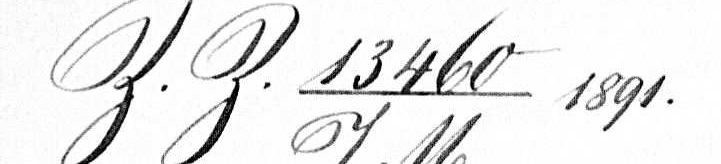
Z. Z. 13460/ 1891.
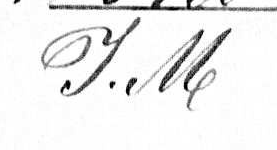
J.M.
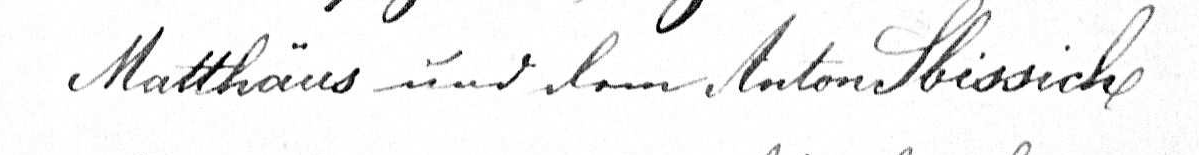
Matthäus und dem Anton Sbissich
